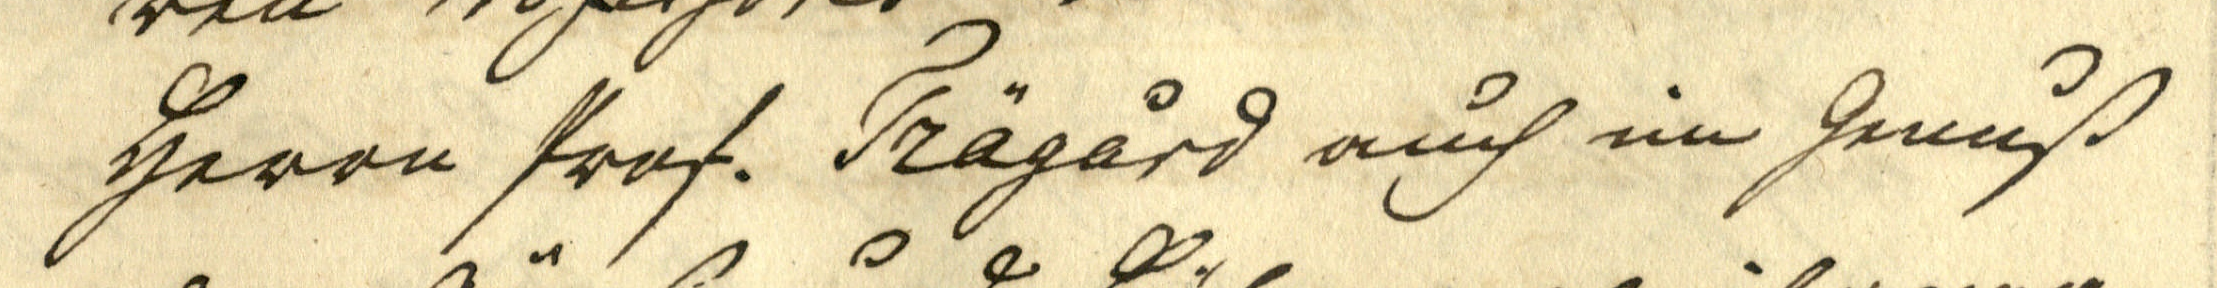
Herrn Prof. Trägård auch im Genuß
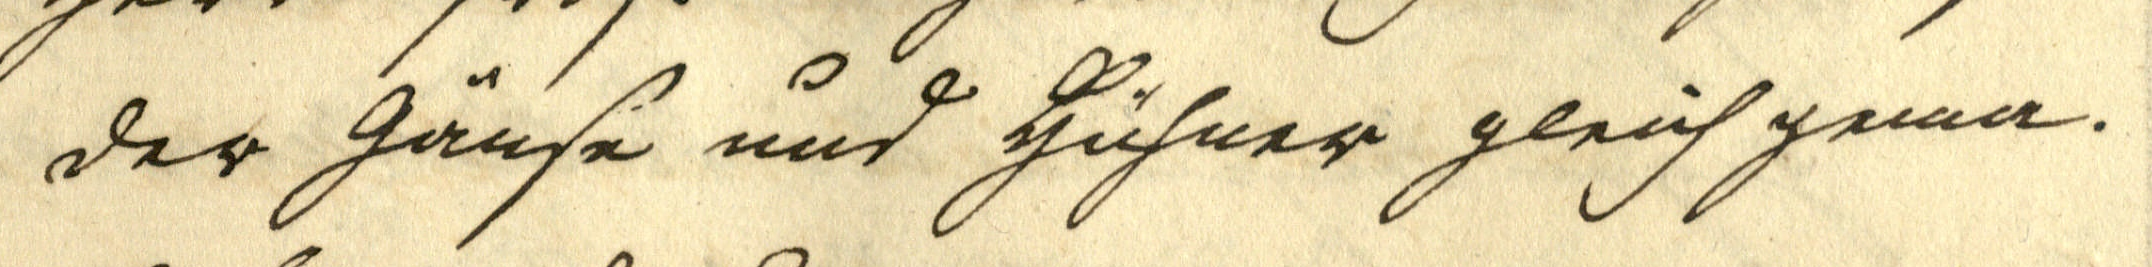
der Gänse und Hühner gleich gema¬
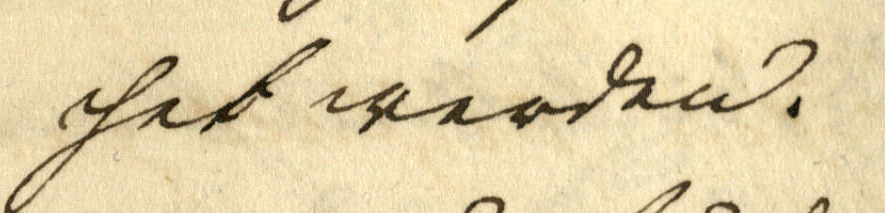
chet werden.
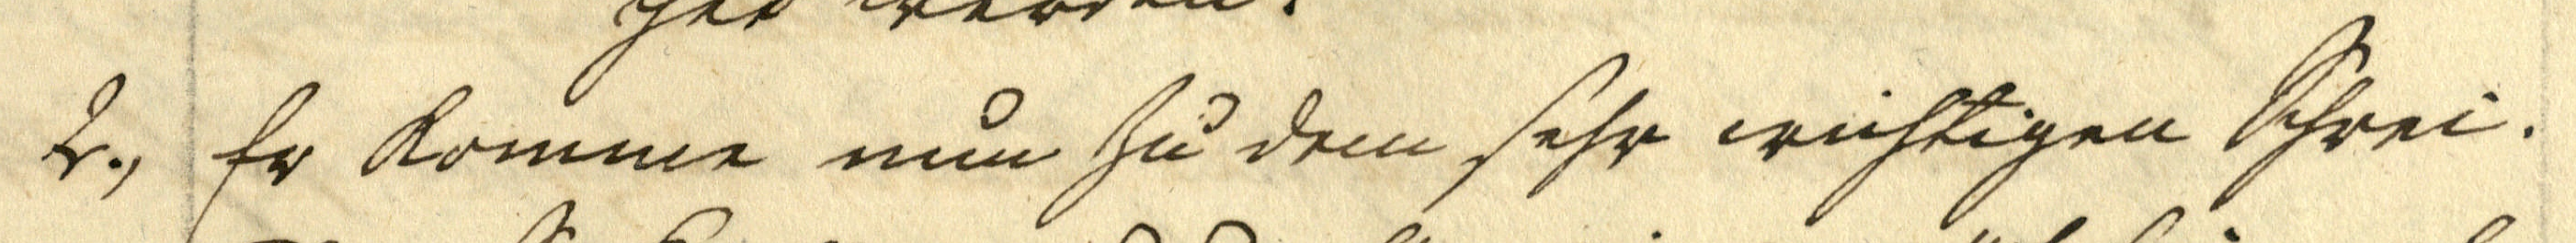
2., Er komme nun zu dem sehr wichtigen Schrei¬
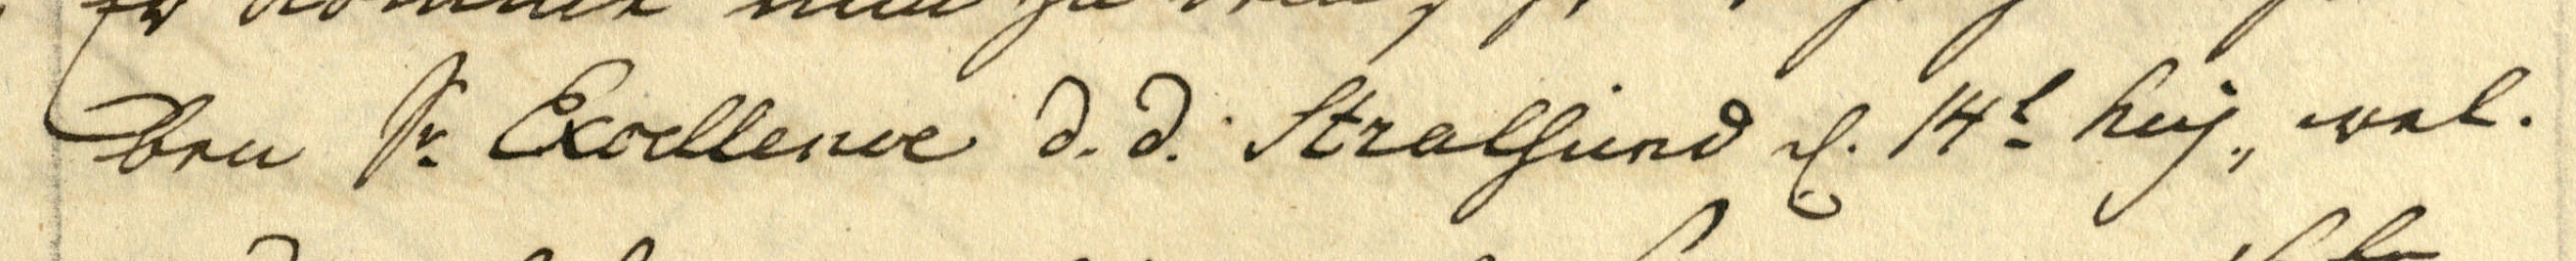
ben Sr Excellence d. d. Stralsund d. 14 t huj., wel¬
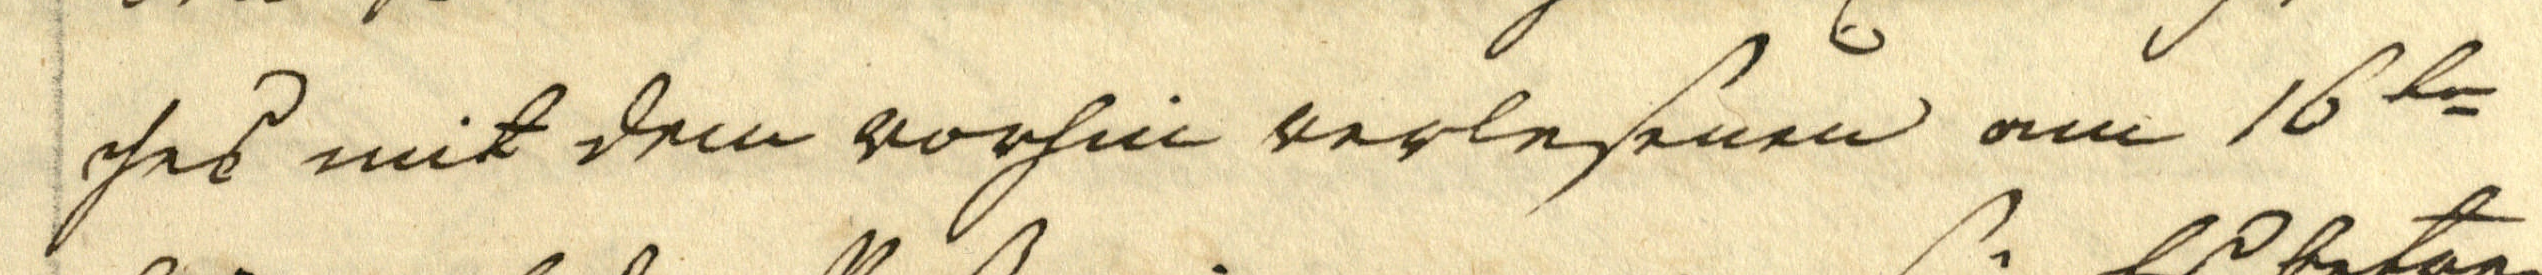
ches mit dem vorhin verlesenen am 16 ten
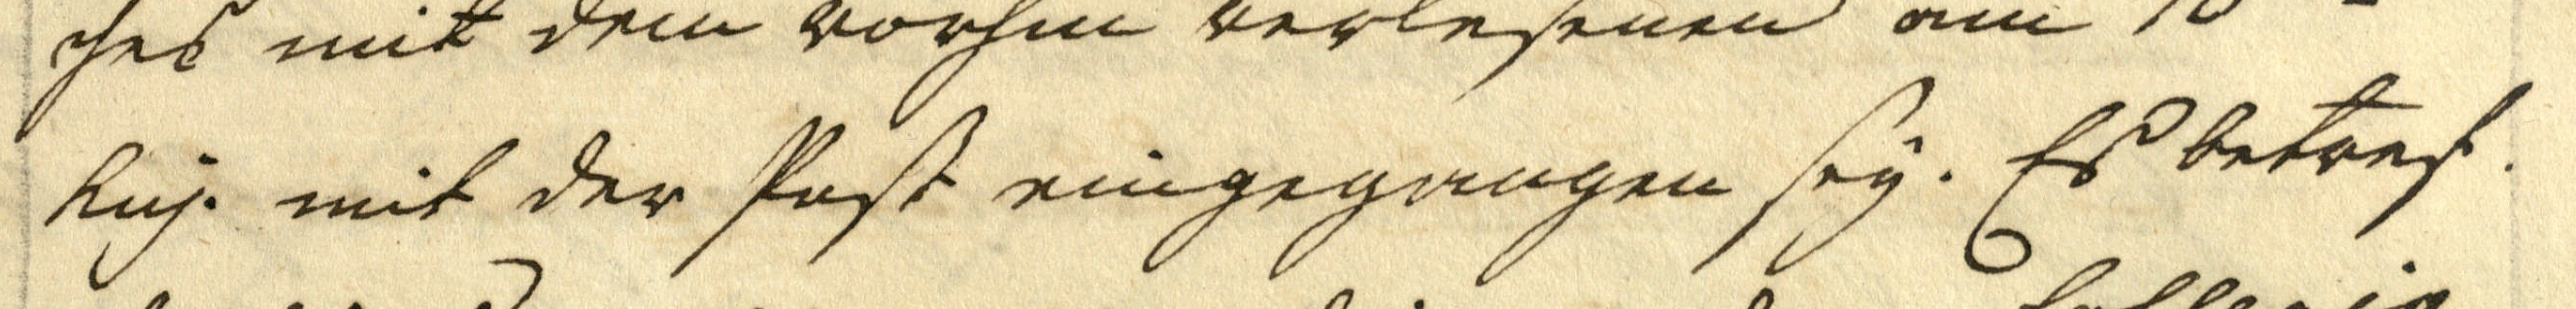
huj. mit der Post eingegangen seÿ. Es betref¬
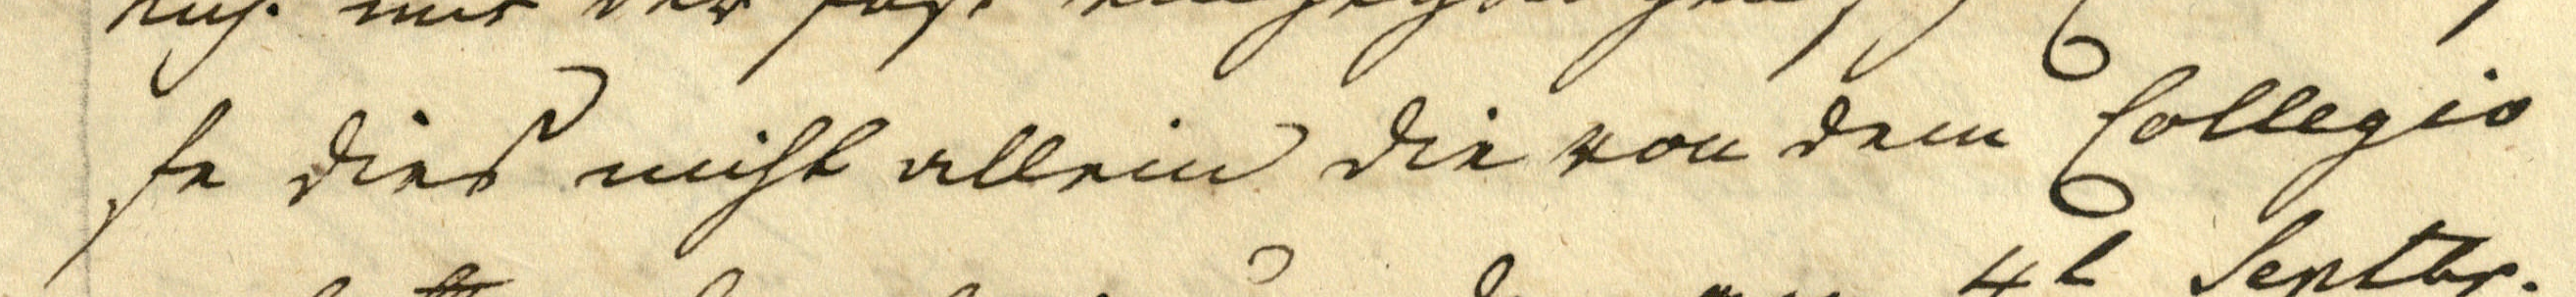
fe dies nicht allein die von dem Collegio
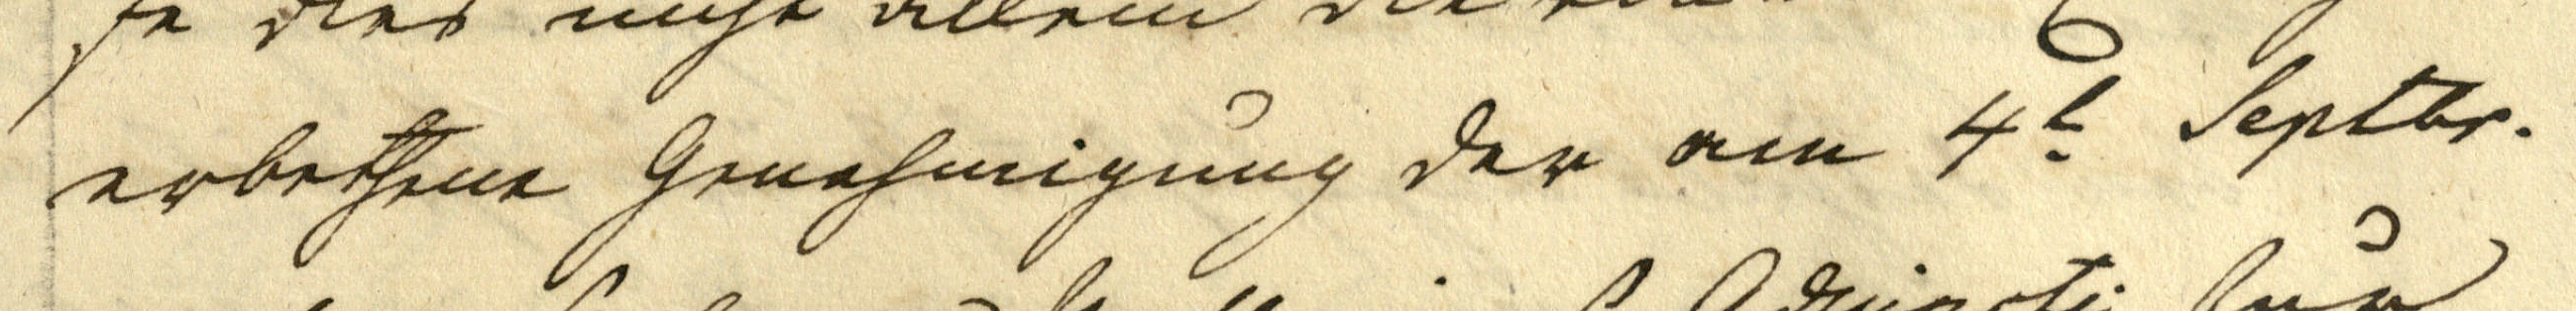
erbethene Genehmigung der am 4 t Septbr.
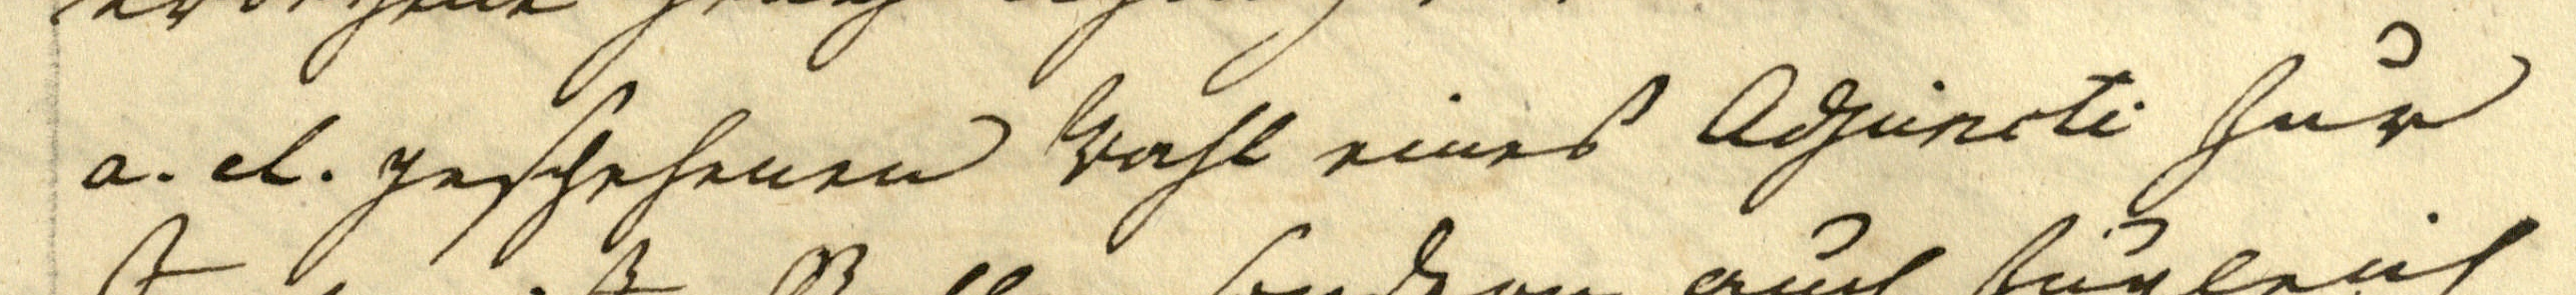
a. et. geschehenen Wahl eines Adjuncti zur
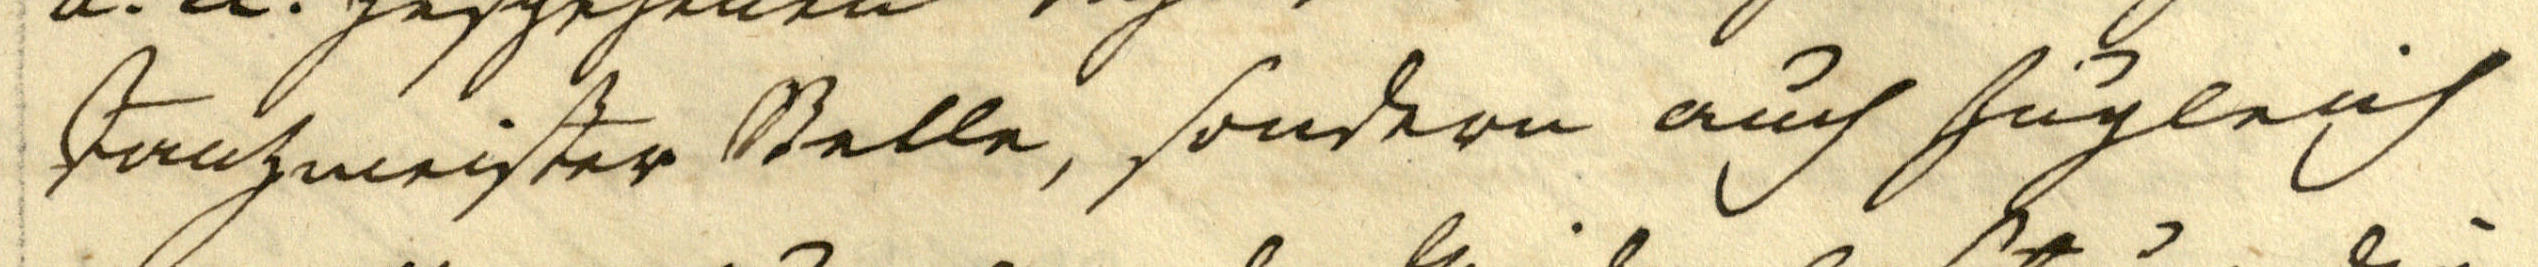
Tanzmeister Stelle, sondern auch zugleich
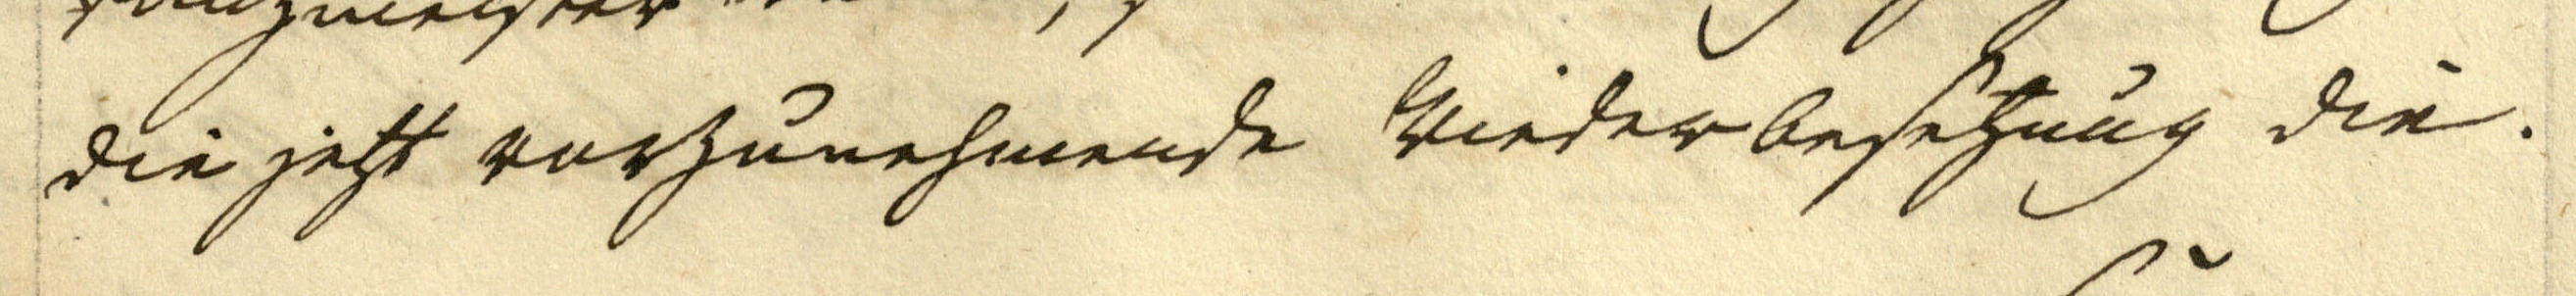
die jetzt vorzunehmende Wiederbesetzung die¬
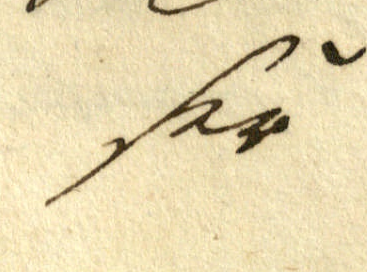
ser
